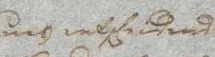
neues entscheidendes.
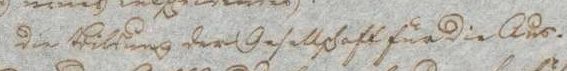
Die Bildung der Gesellschaft für die Aus-
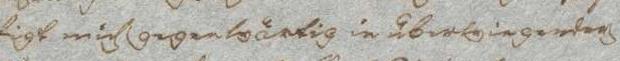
tigt mich gegenwärtig in überwiegender
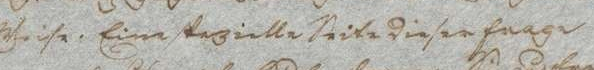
Weise. Eine spezielle Seite dieser Frage
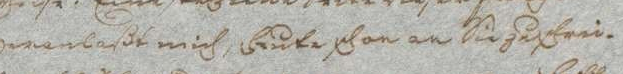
veranlaßt mich, heute schon an Sie zu schrei-
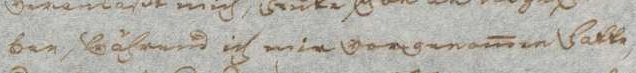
ben, während ich mir vorgenommen hatte,
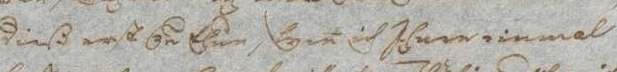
dieß erst zu thun, wenn ich Ihnen einmal
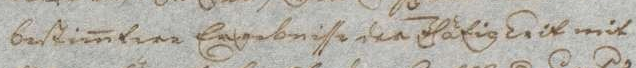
bestimmtere Ergebnisse der Thätigkeit mit-
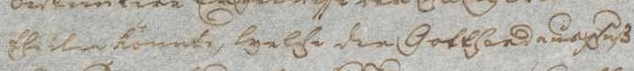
theilen könnte, welche der Gotthardausschuß
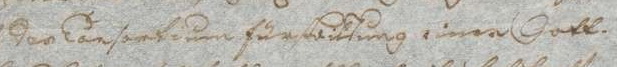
das Consortium für Leitung einer Gott-
